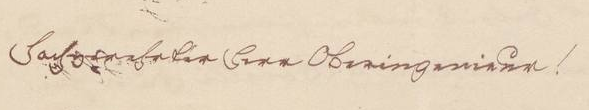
Hochverehrter Herr Oberingenieur!
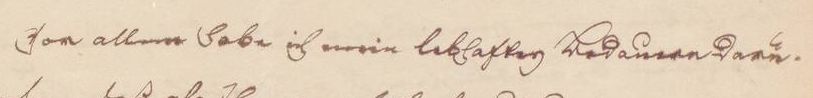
Vor allem habe ich mein lebhaftes Bedauern darü-
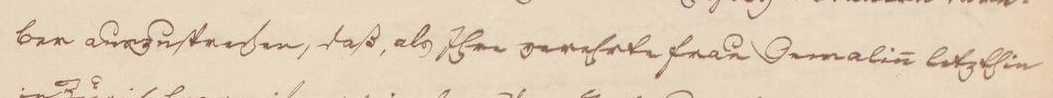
ber auszusprechen, daß, als Ihre verehrte Frau Gemalinn letzthin
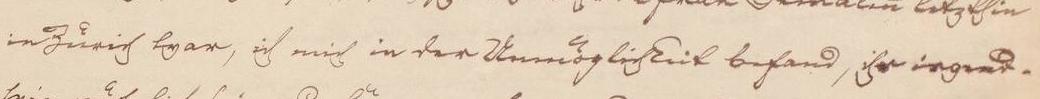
in Zürich war, ich mich in der Unmöglichkeit befand, ihr irgend-
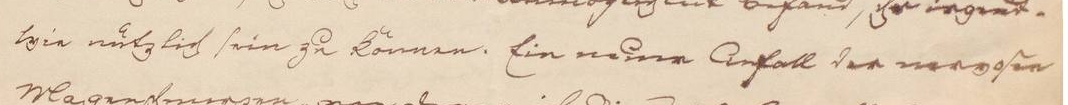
wie nützlich sein zu können. Ein neuer Anfall der nervösen
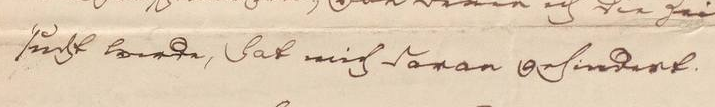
sucht werde, hat mich daran gehindert.
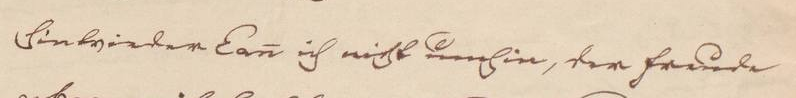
Hinwieder kann ich nicht umhin, der Freude
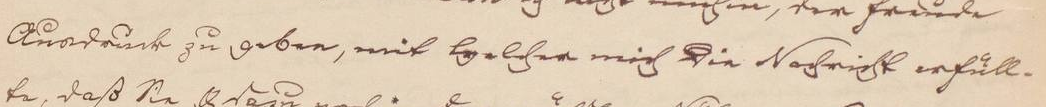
Ausdruck zu geben, mit welcher mich die Nachricht erfüll-
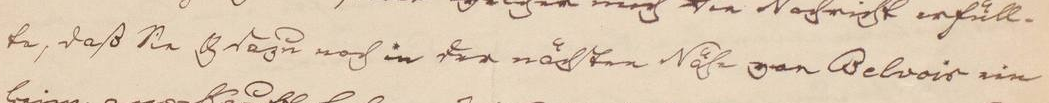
te, dass Sie & dazu noch in der nächsten Nähe von Belvoir ein
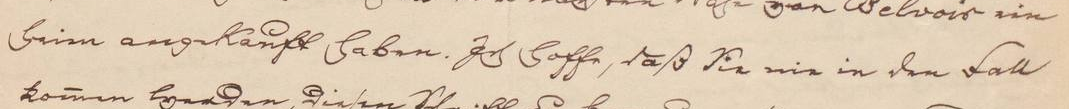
Heim angekauft haben. Ich hoffe, dass Sie nie in den Fall
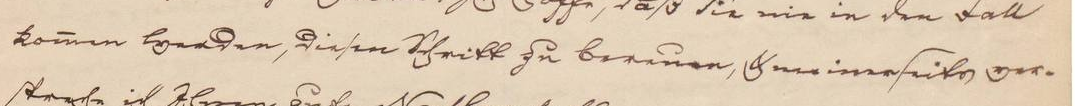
kommen werden, diesen Schritt zu bereuen, & meinerseits ver-
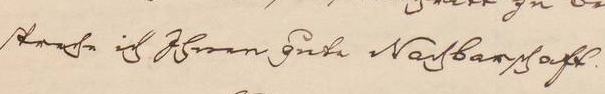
spreche ich Ihnen gute Nachbarschaft.
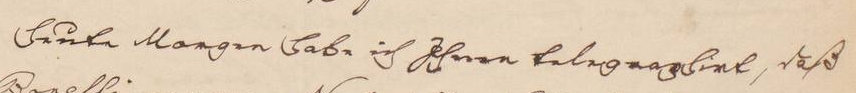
Heute Morgen habe ich Ihnen telegraphirt, daß
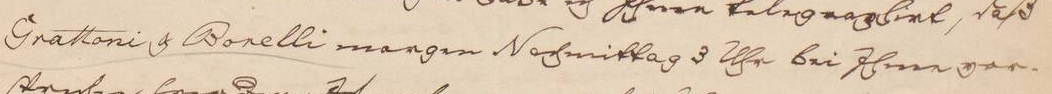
Grattoni & Borellimorgen Nachmittag 3 Uhr bei Ihnen vor-
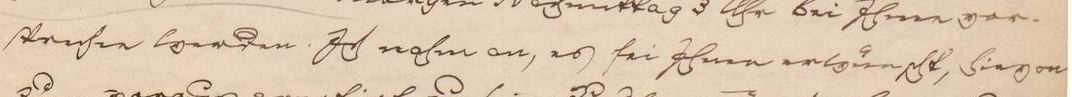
sprechen werden. Ich nahm an, es sei Ihnen erwünscht, hievon
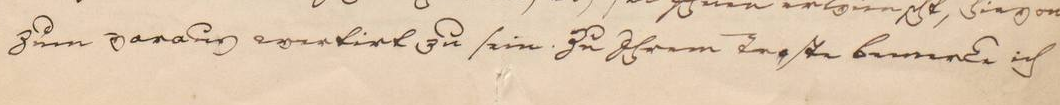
zum voraus avertirt zu sein. Zu Ihrem Troste bemerke ich
